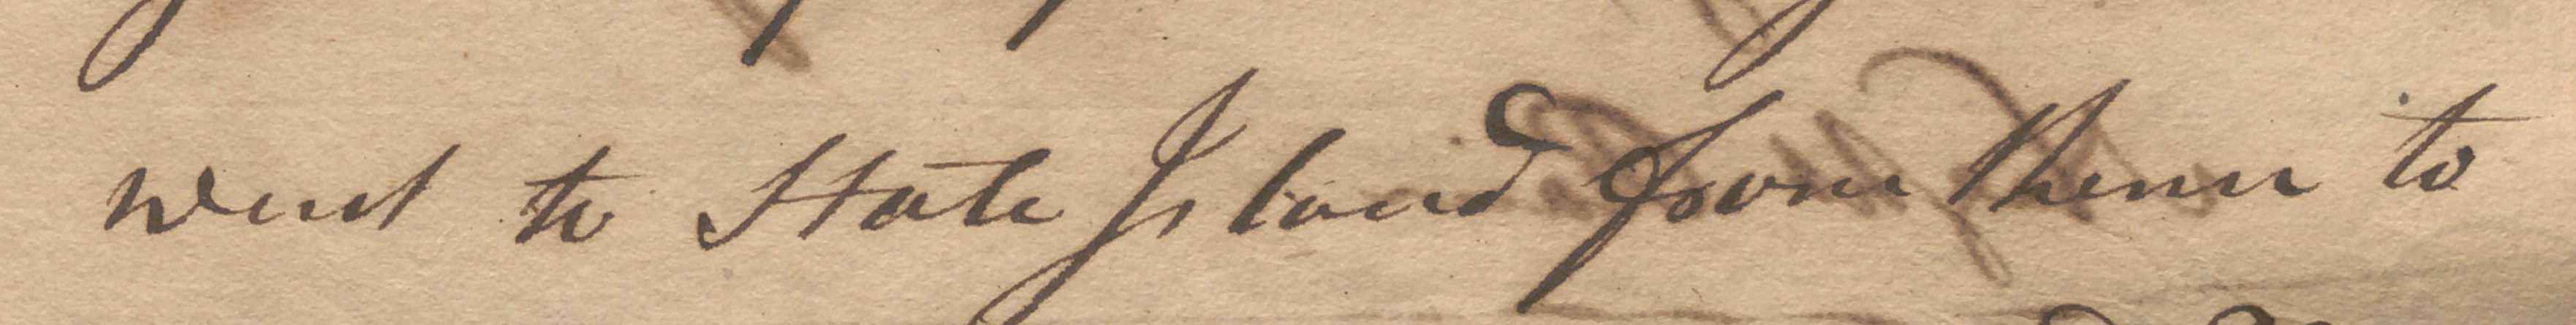went to State Island from thence to
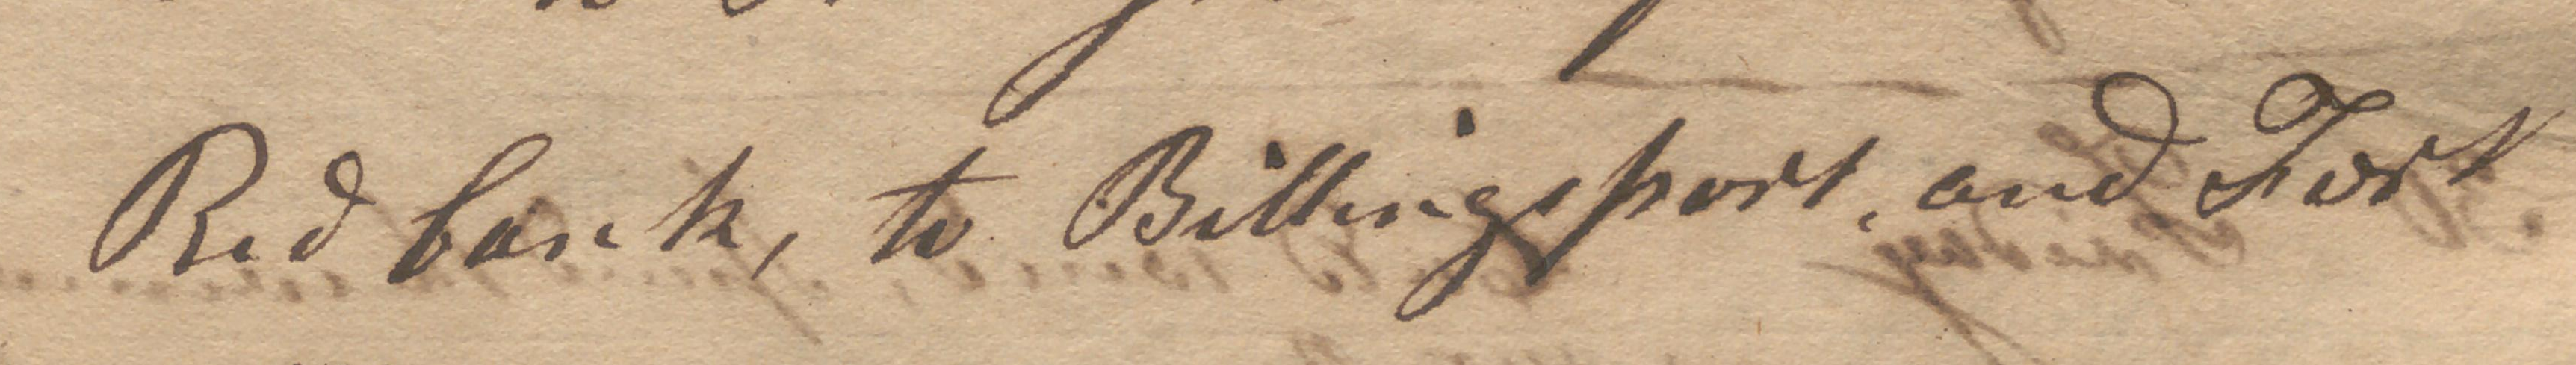Redbank, to Billingsport, and Fort
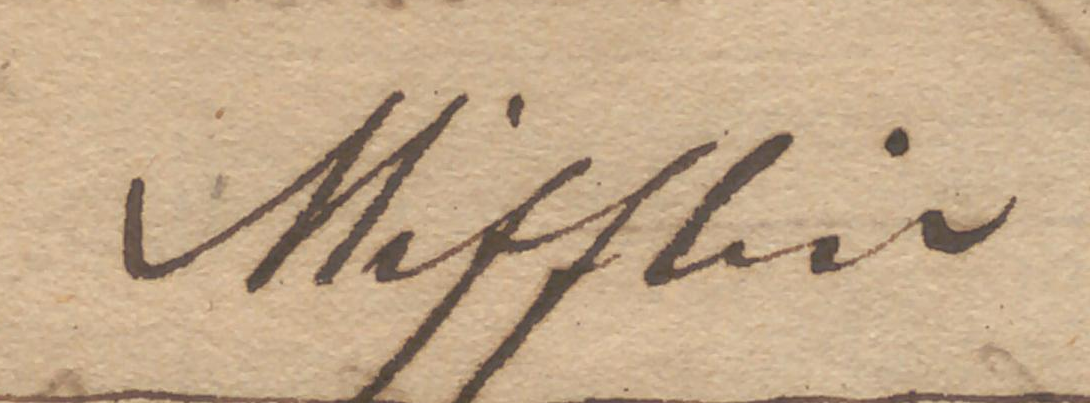Mifflin
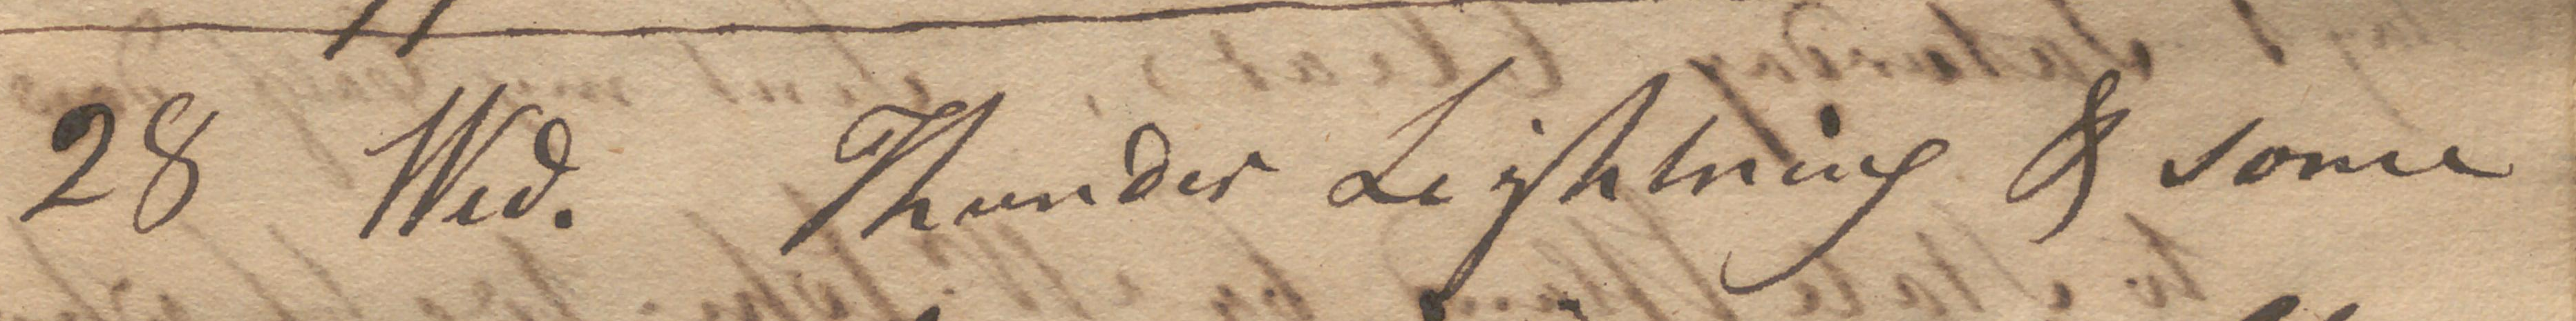28 Wed. Thunder Lightnning & some
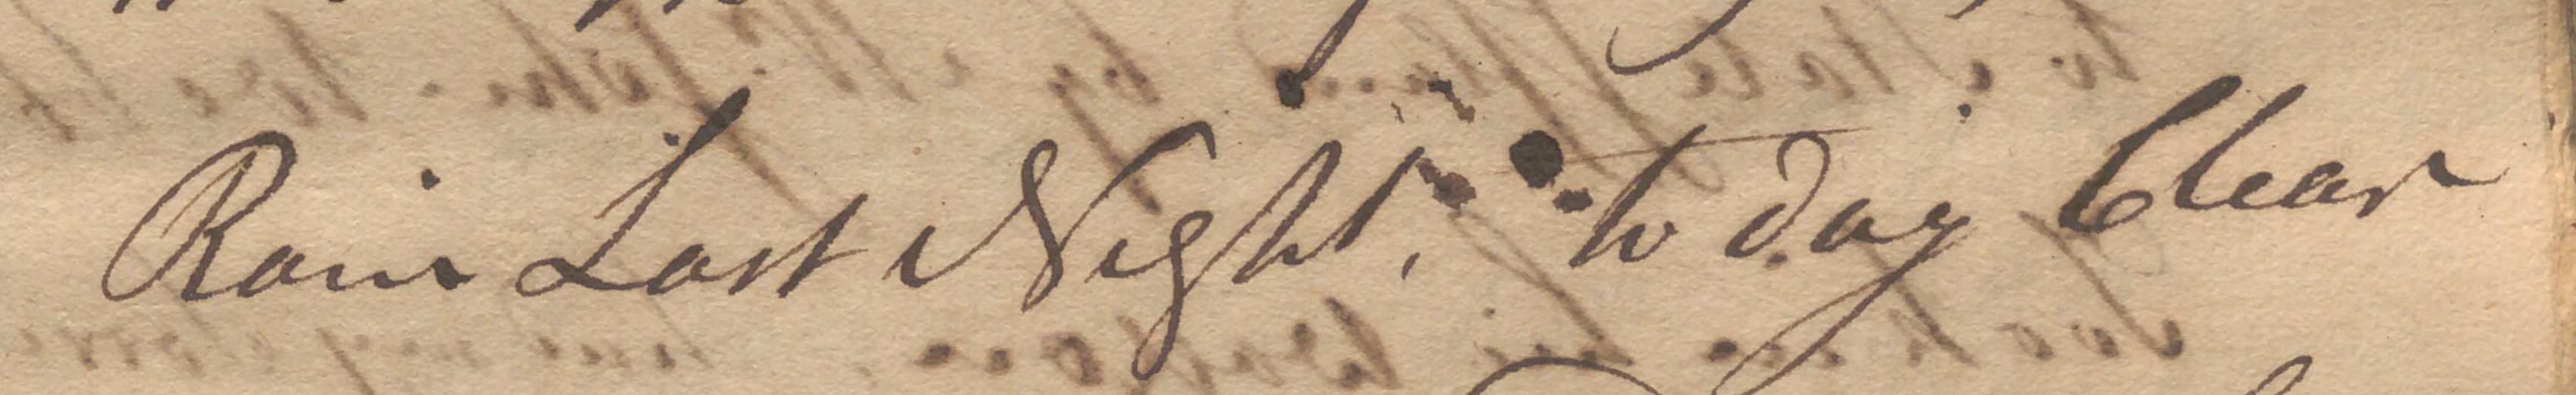Raur Last Night. to day Clear
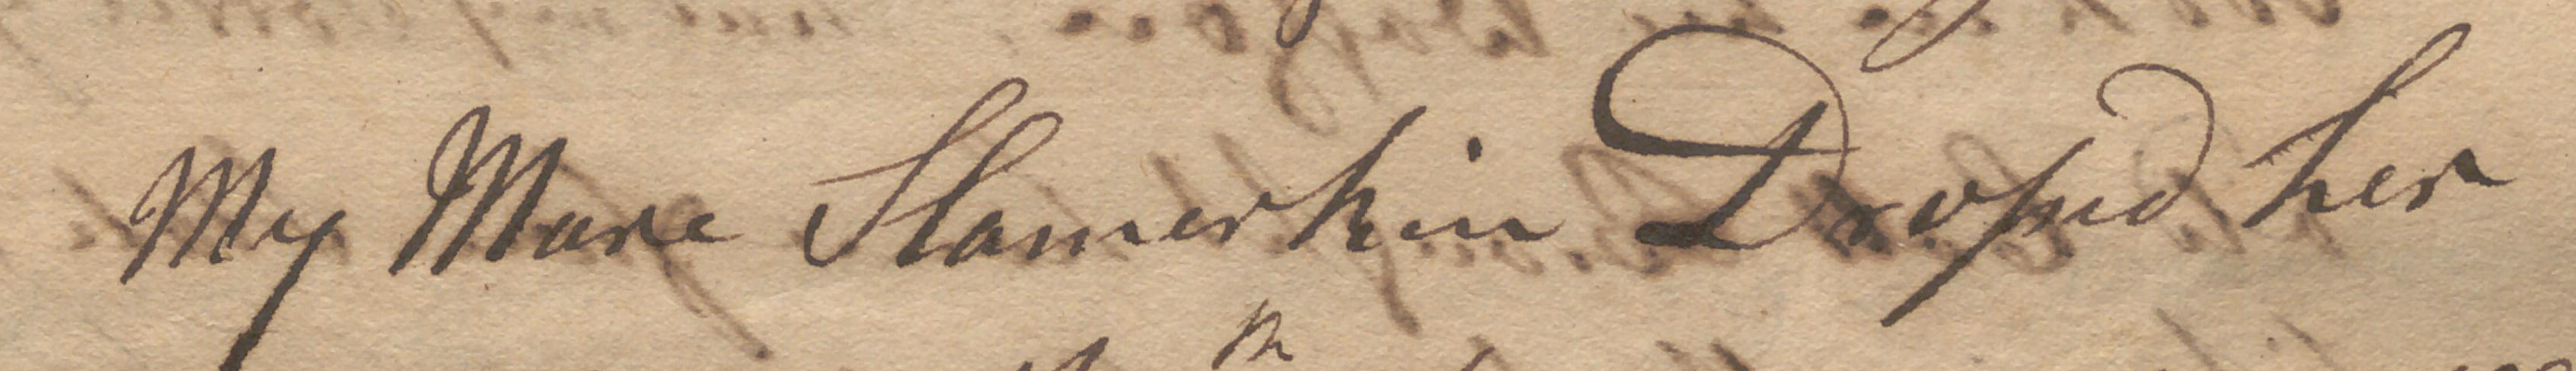My Mare Slamerkin Droped her
